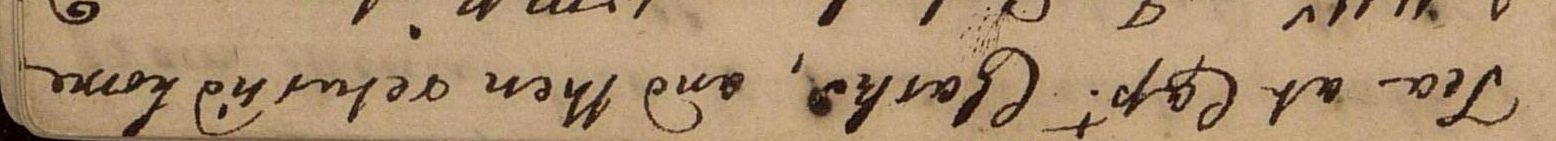Tea at Cap^t. Clarks, and then return'd home
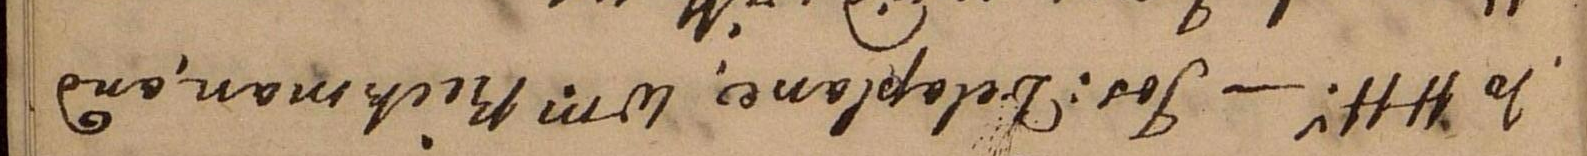to HH^s. - Jos. Delaplane, W^m. Rickman, and
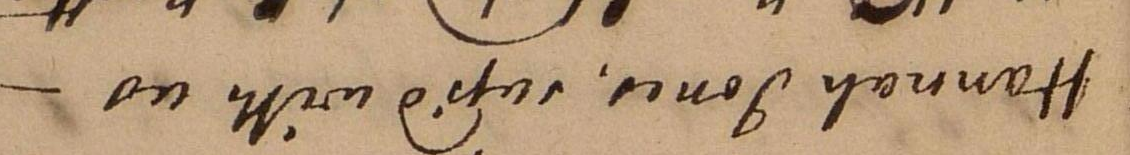Hannah Jones, sup'd with us -
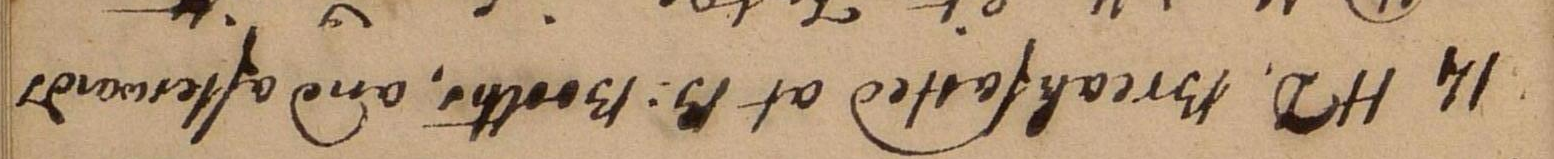14 HD. Breakfasted at B: Booths, and afterwards
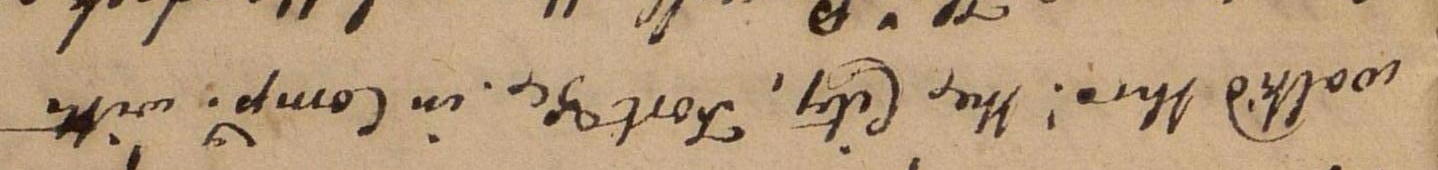walk'd thro'. the City, Fort &c. in Comp^y. with
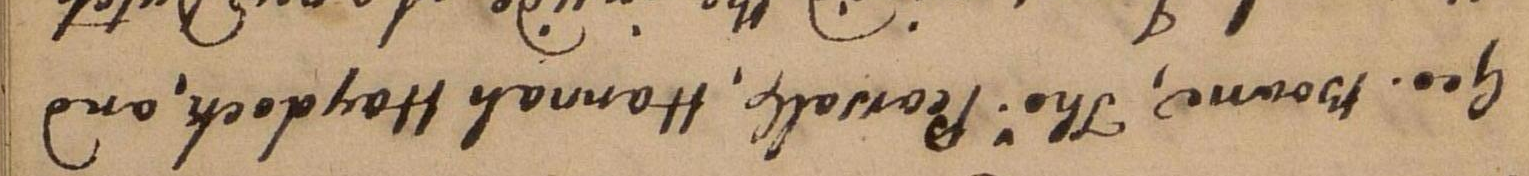Geo. Bowne, Tho^s. Pearsall, Hannah Haydock, and
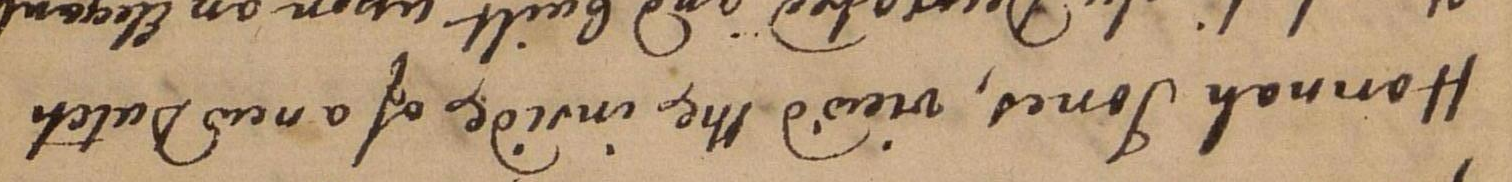Hannah Jones, view'd the inside of a new Dutch
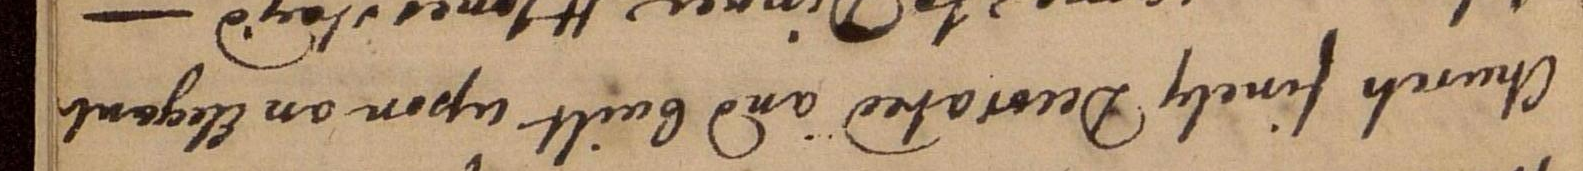Church finely Decorated and built upon Elegant
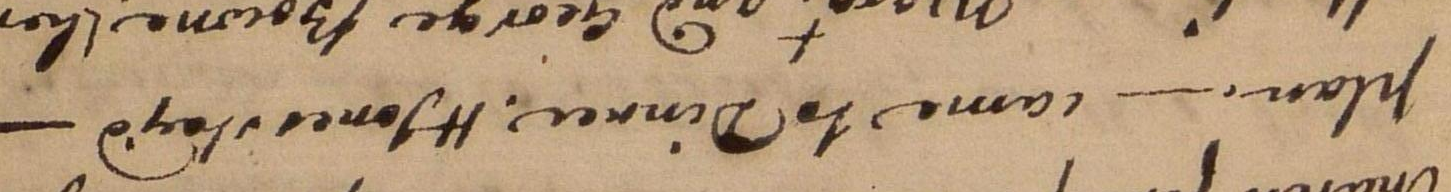plan. - came to Dinner. H Jones stay'd -
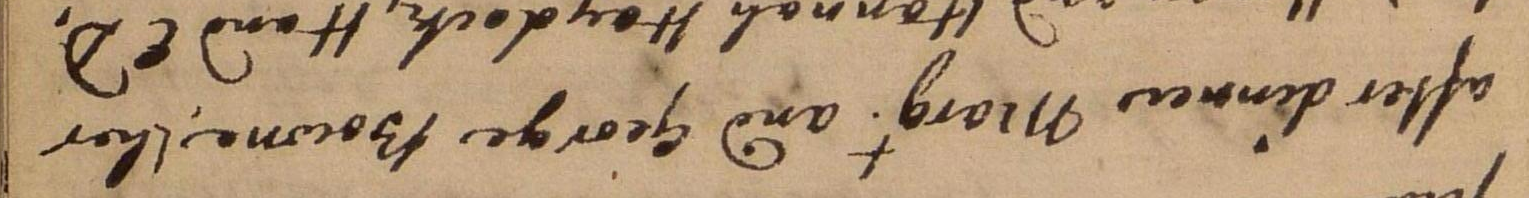after dinner Marg^t. and George Bowne (her
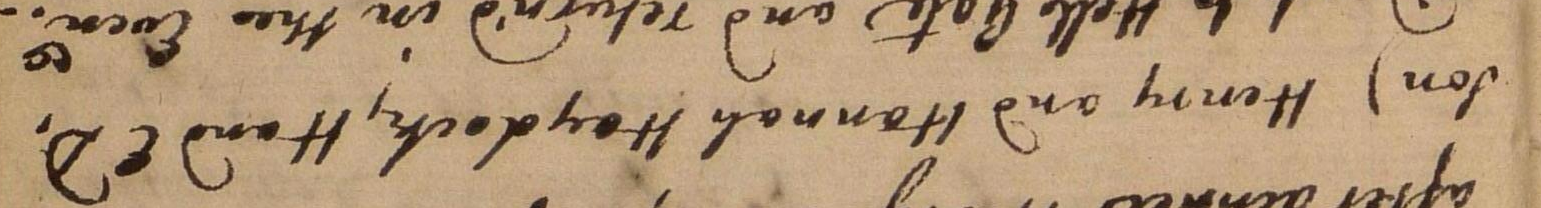Son) Henry and Hannah Haydock, H and ED.
